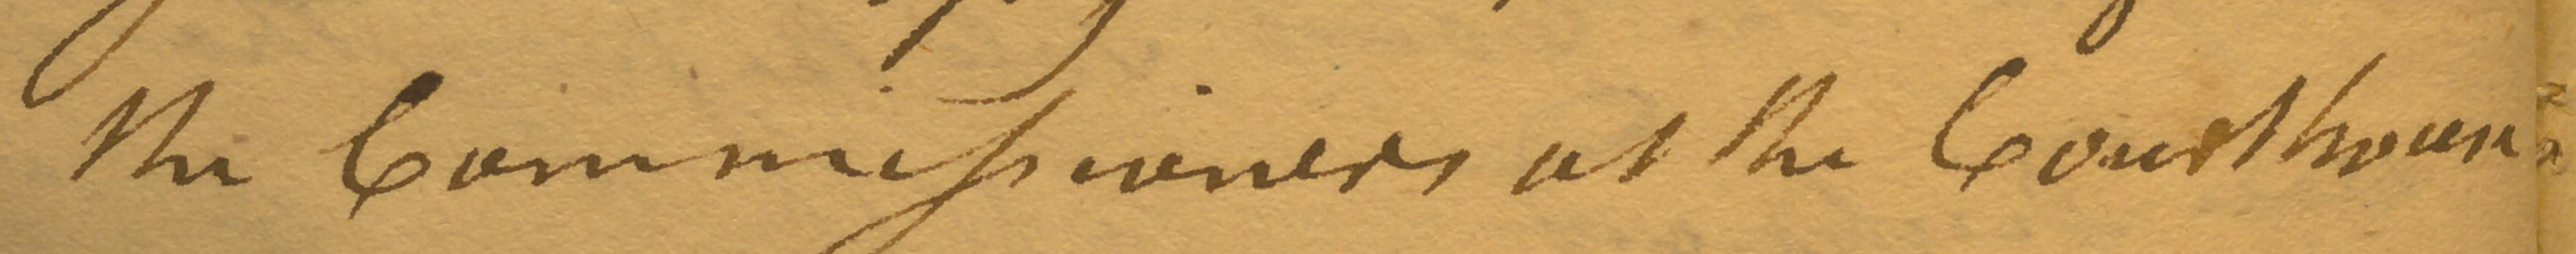the Commissioners at the Courthouse
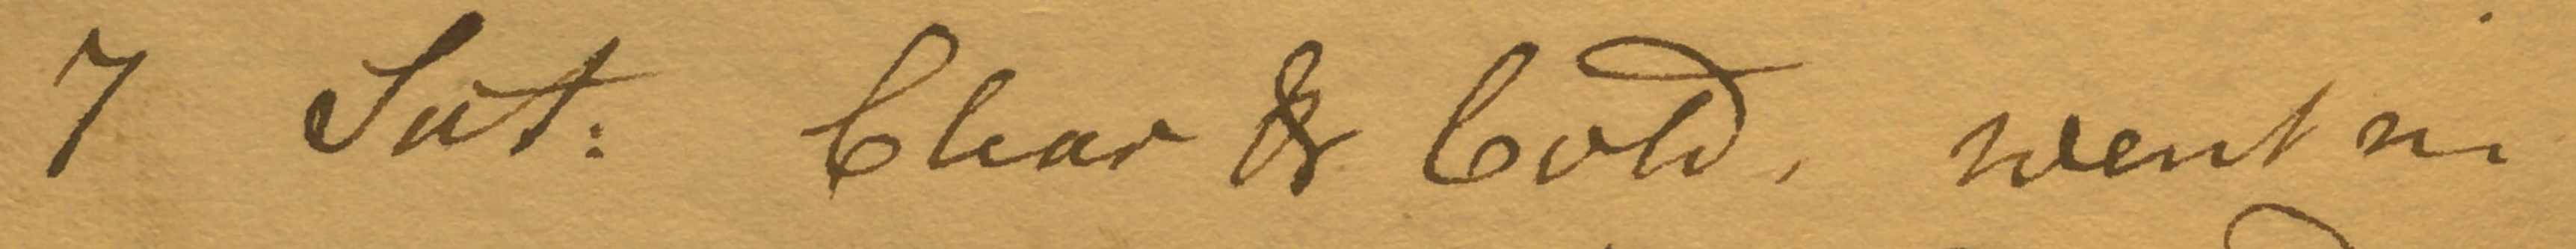7 Sat. Clear & Cold, went in
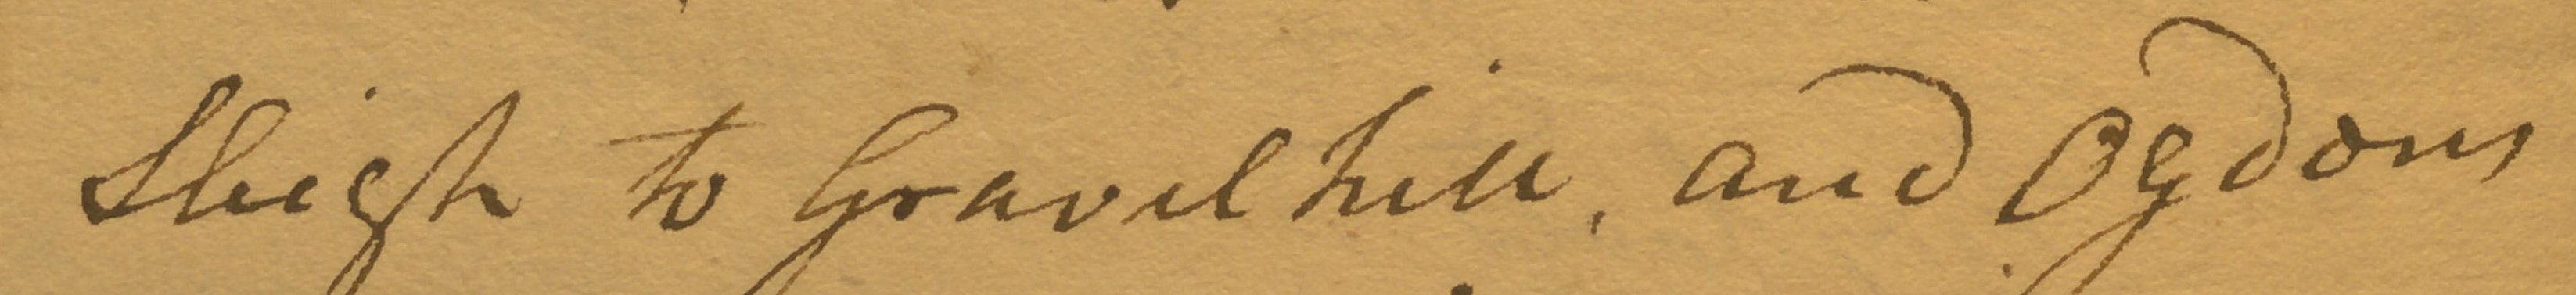Sleigh to Gravelhill and Ogdons
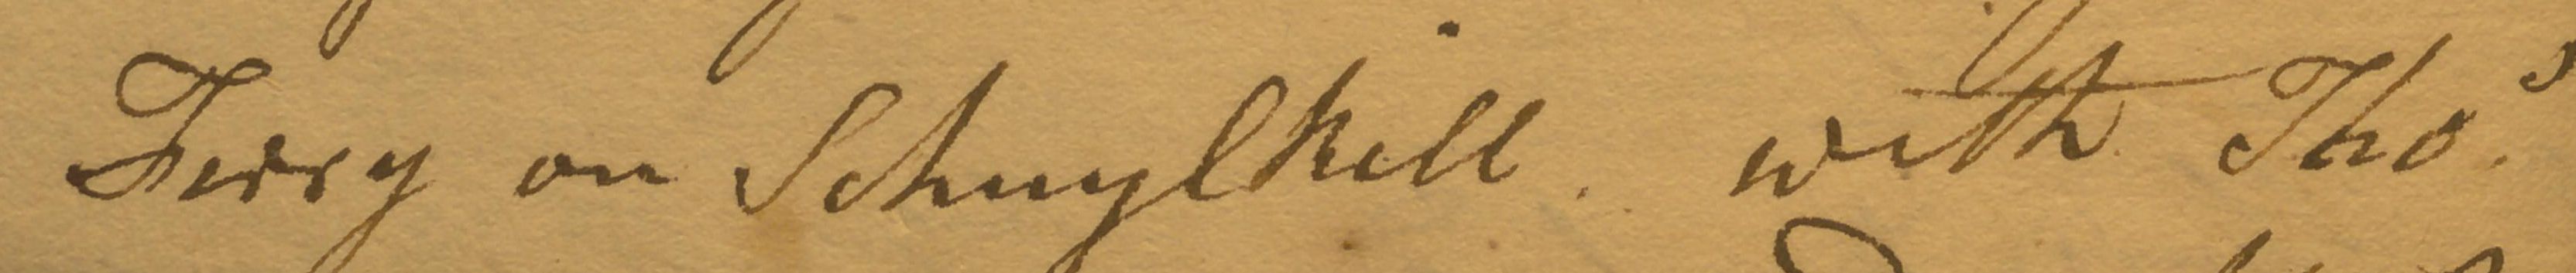Ferry on Schuylkill, with Tho^s.
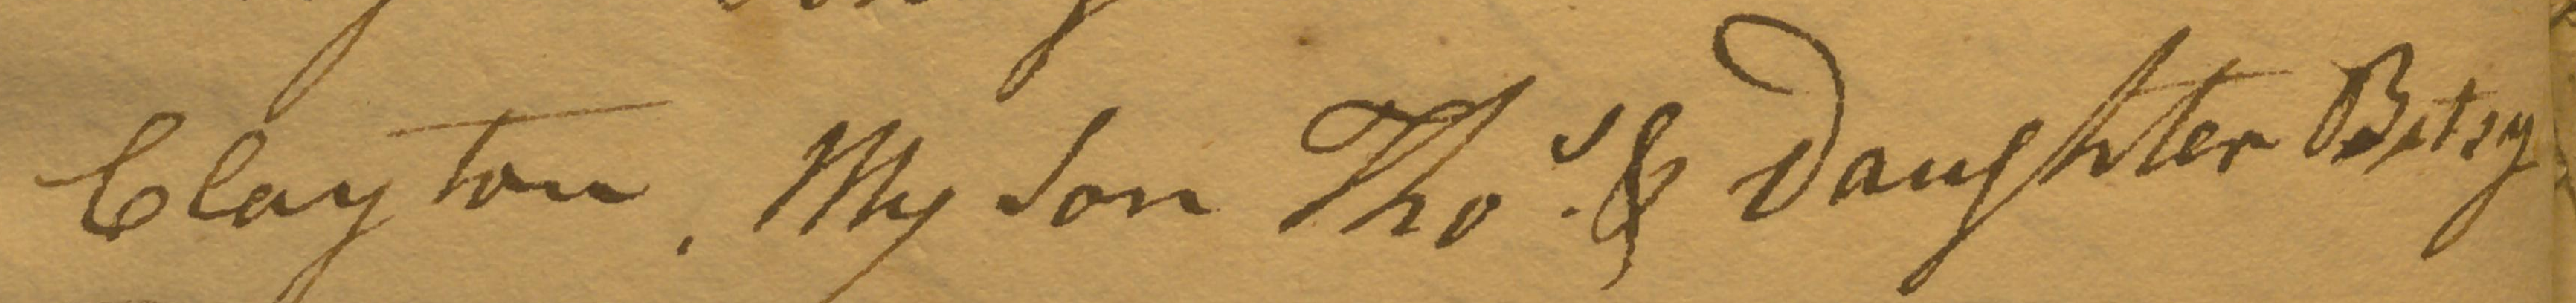Clayton, My Son Tho^s. & daughter Betsy
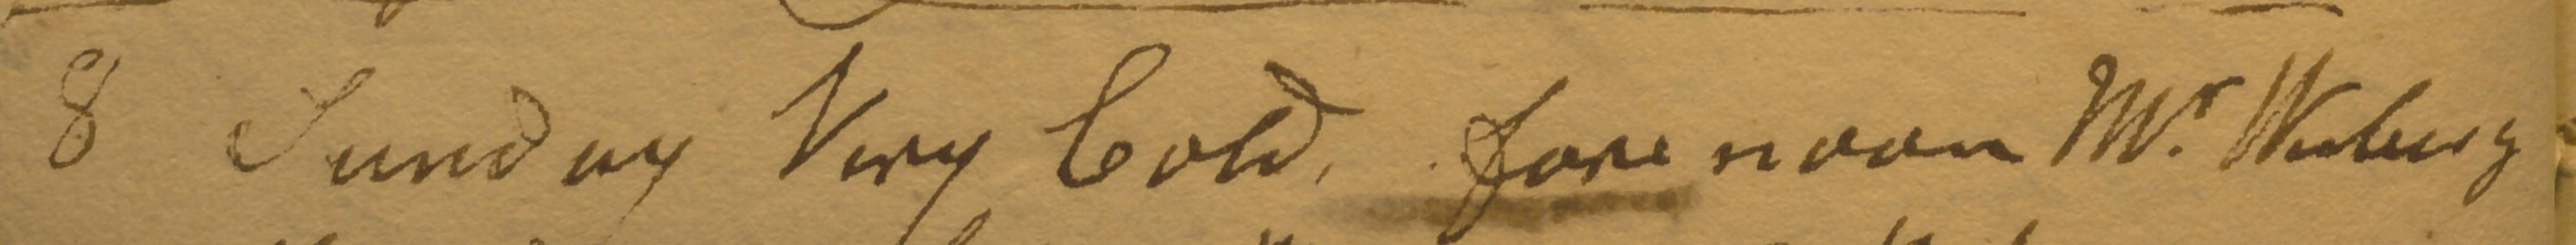8 Sunday Very Cold. forenown M^r. Weiberg
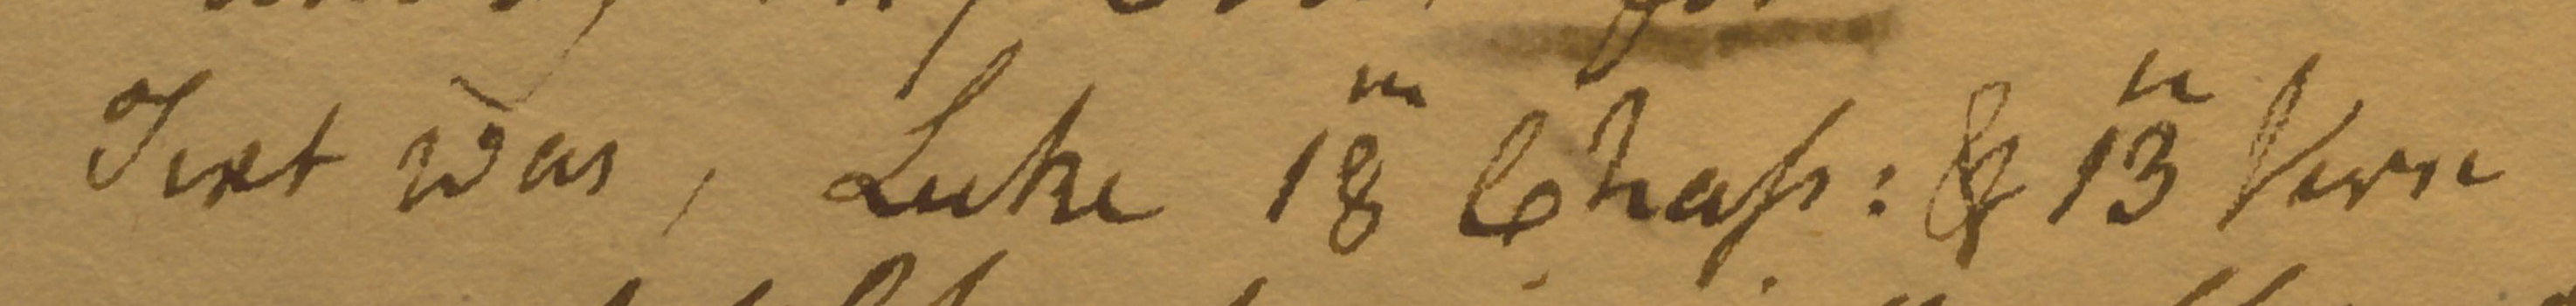Text was, Luke 18^th Chap: & 13^th Verse
